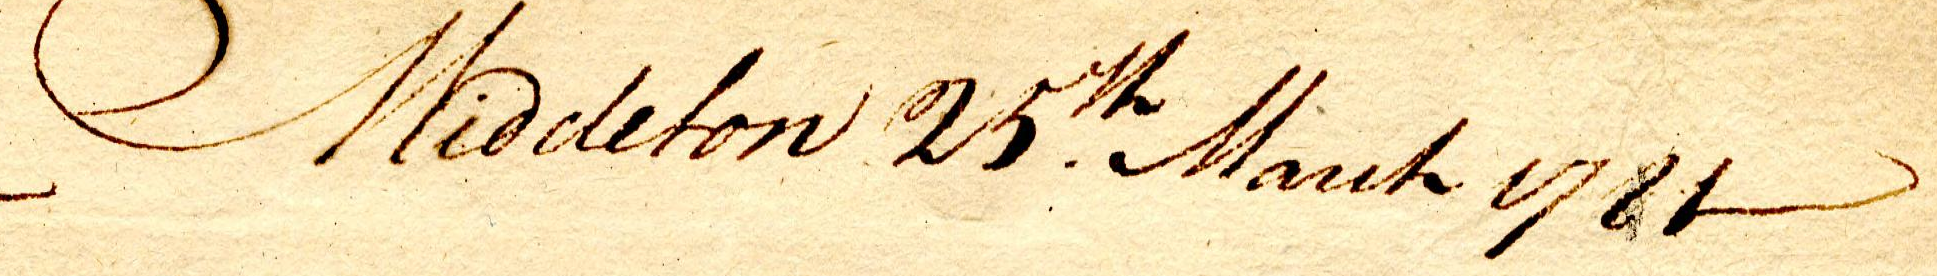Middeton 25^th. March 1781
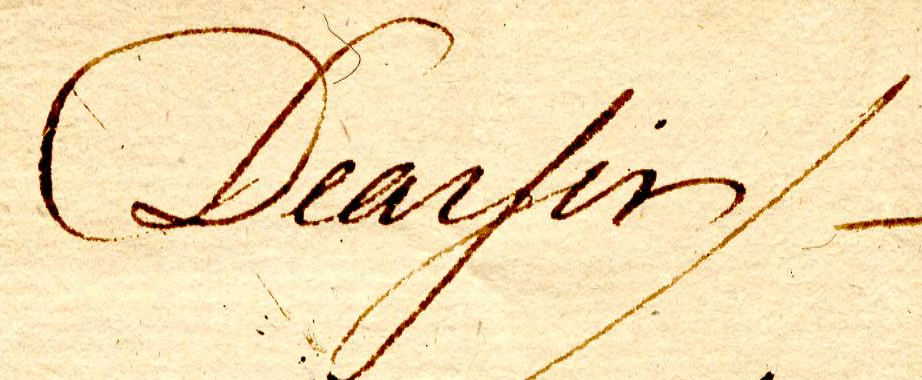Dear Sir
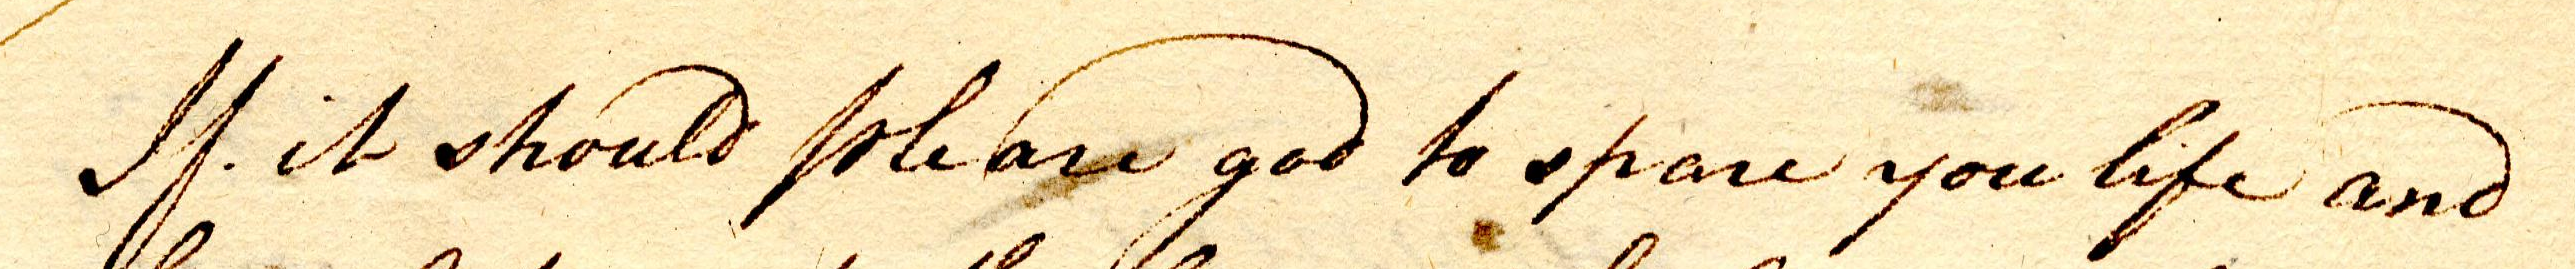If it should please god to spare you life and
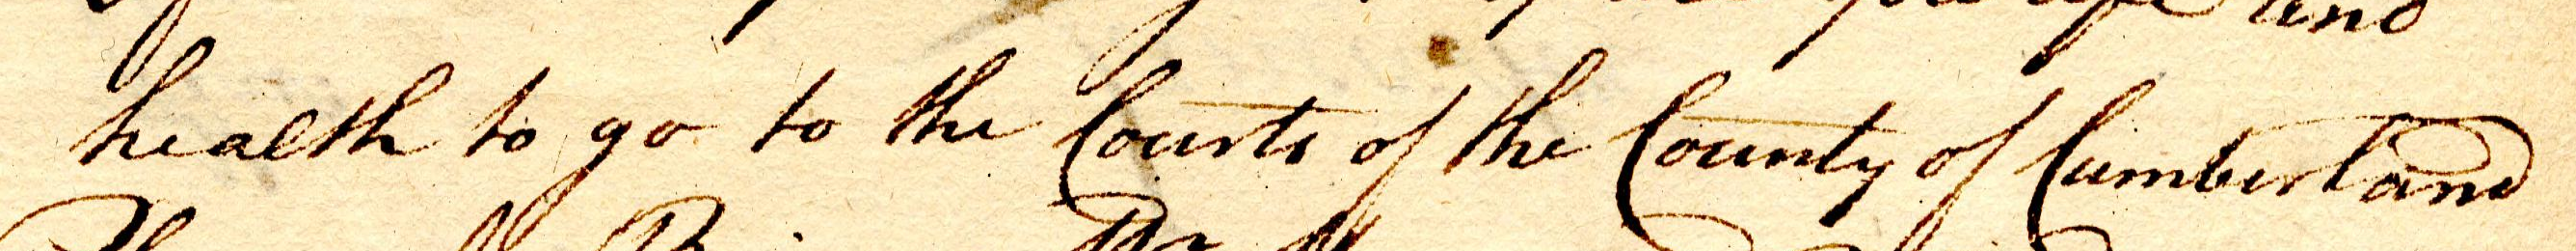health to go to the Courts of the County of Cumberland
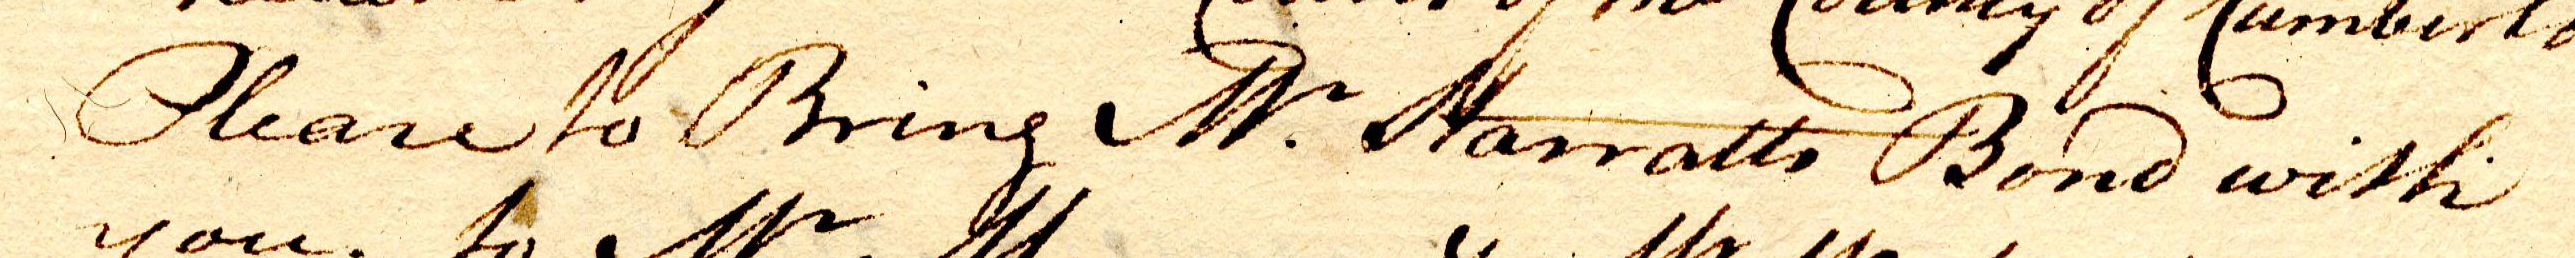Please to Bring M^r. Harratts Bond with
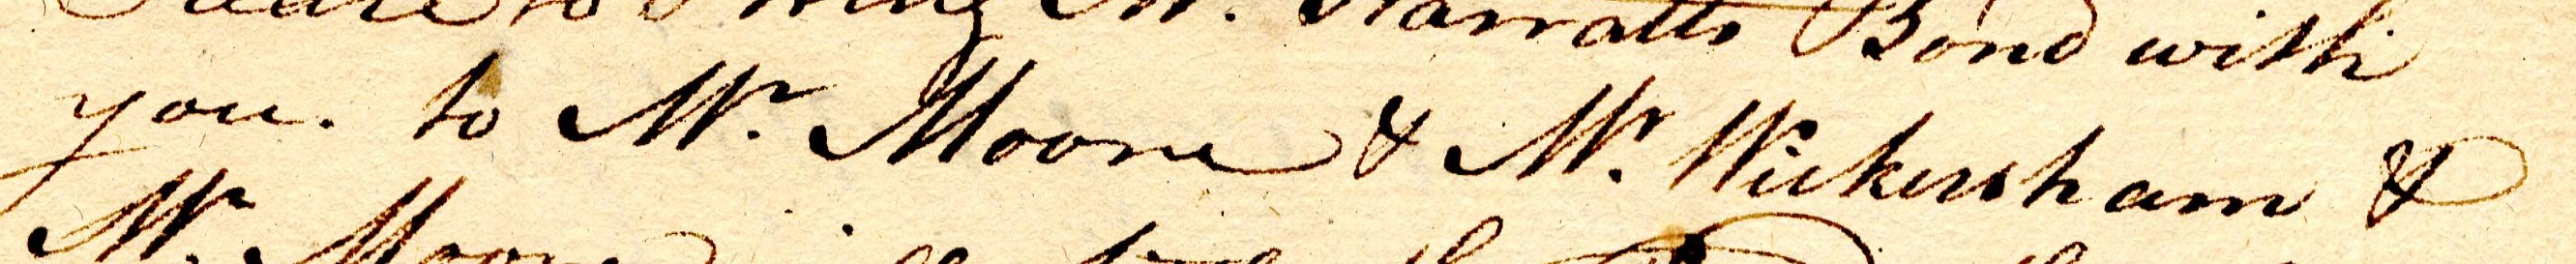you. so M^r. Moore & M^r. Wickersham &
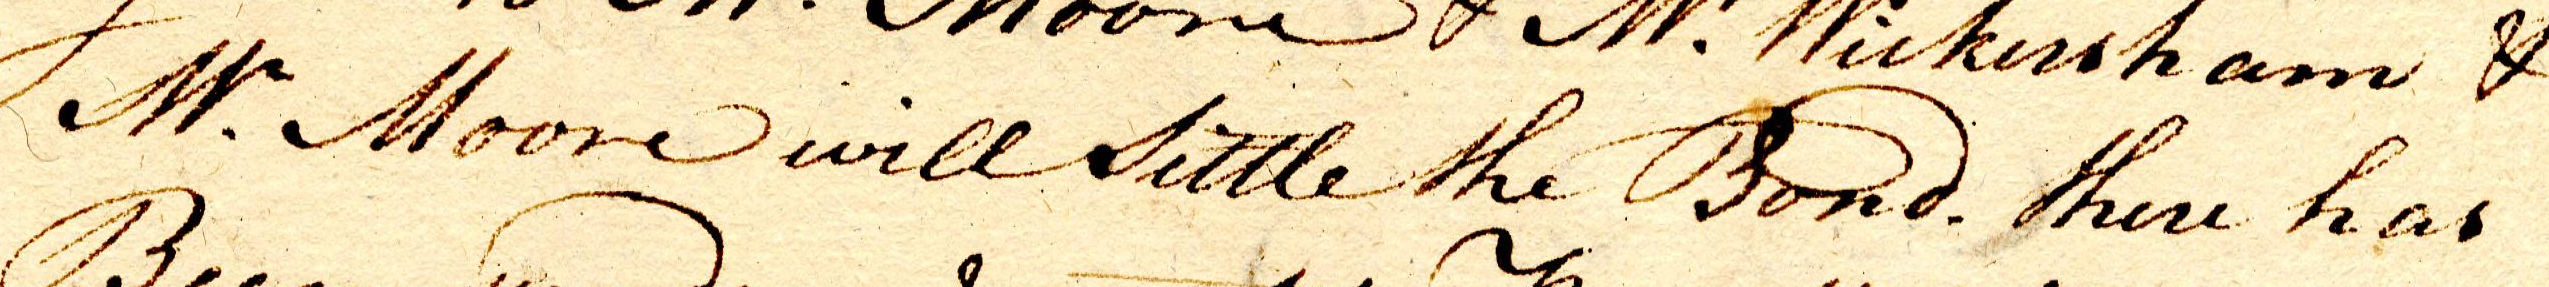M^r. Moore will settle the Bond. there has
